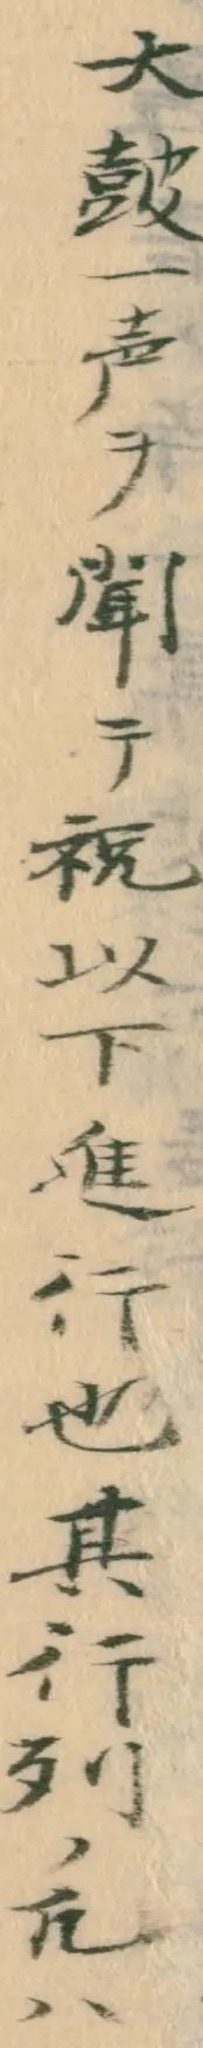太鼓一声ヲ聞テ祝以下進行也其行列ノ凡ハ
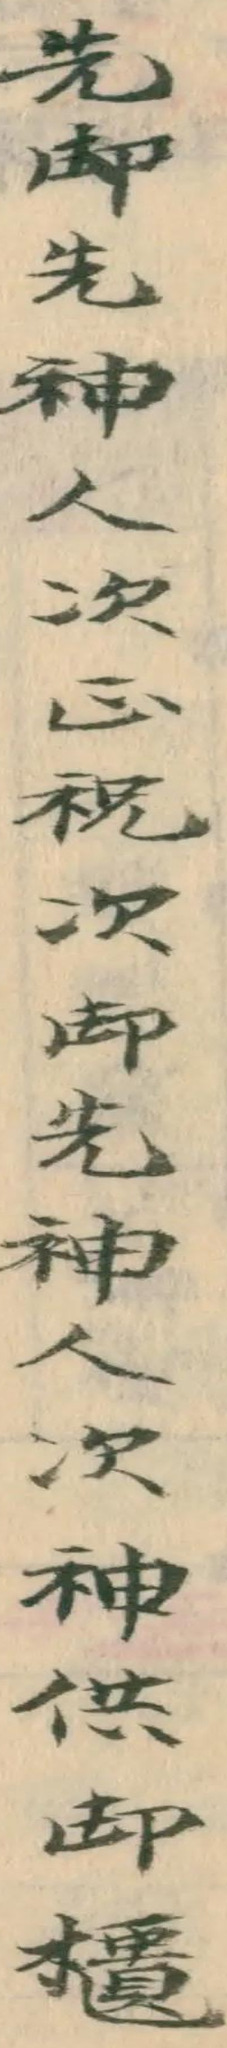先御先神人次正祝次御先神人次神供御櫃
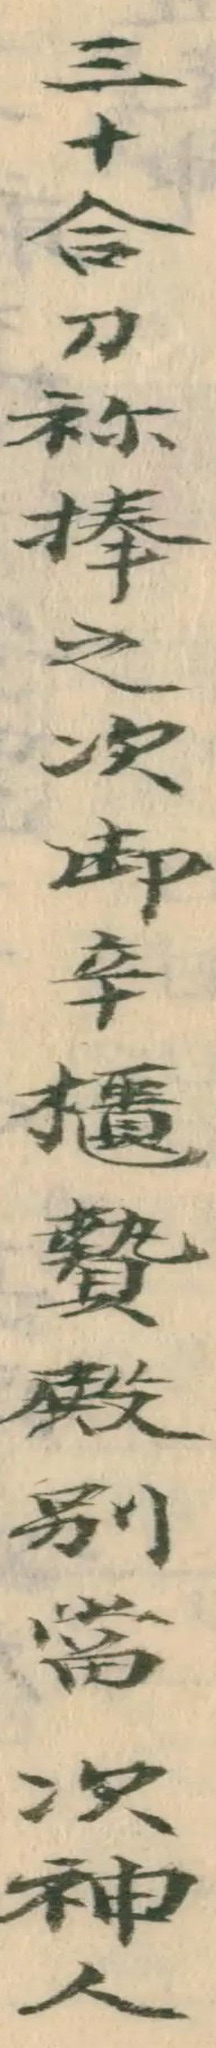三十合刀禰捧之次御辛櫃贄殿別当次神人
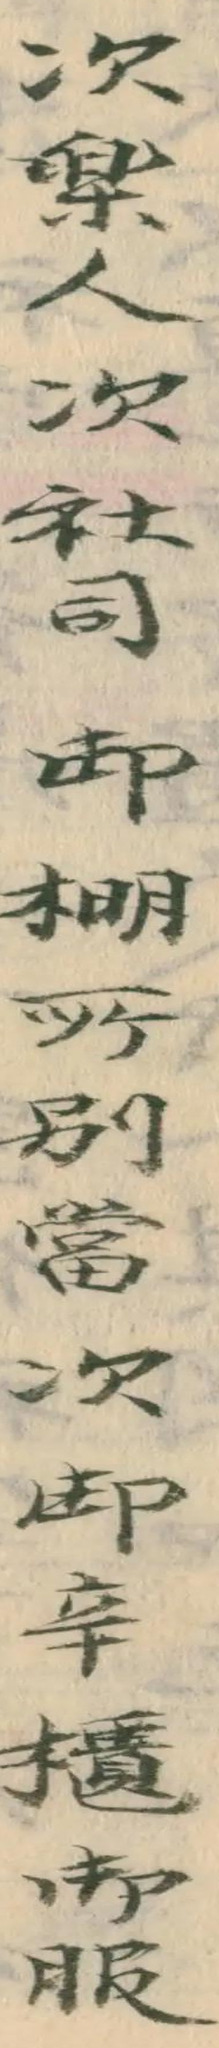次楽人次社司御棚所別当次御辛櫃御服
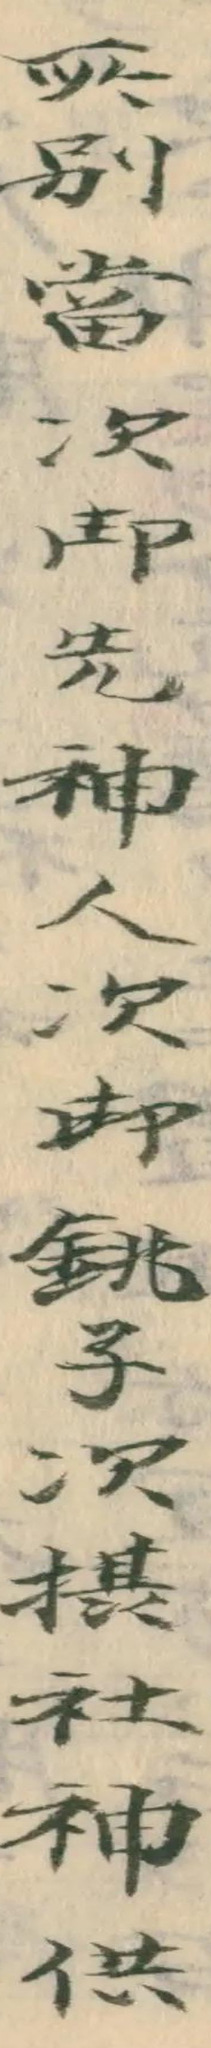所別当次御先神人次御銚子次摂社神供
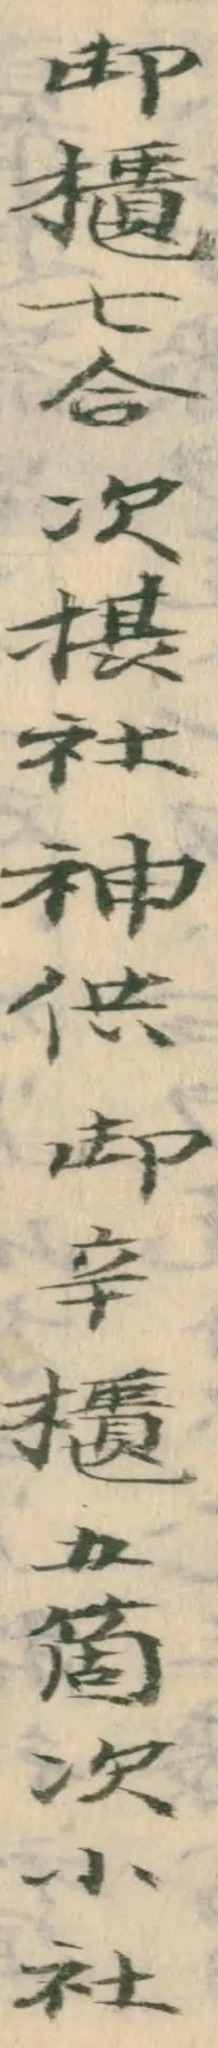御櫃七合次摂社神供御辛櫃五箇次小社
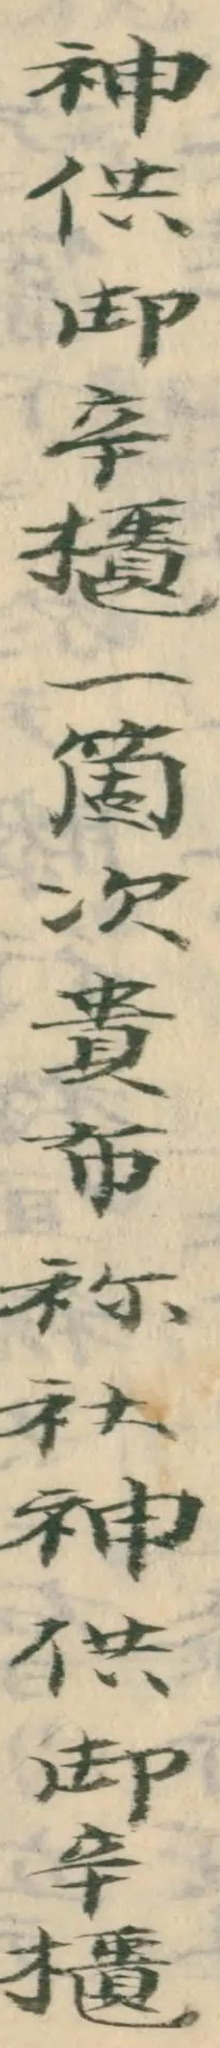神供御辛櫃一箇次貴布禰社神供御辛櫃
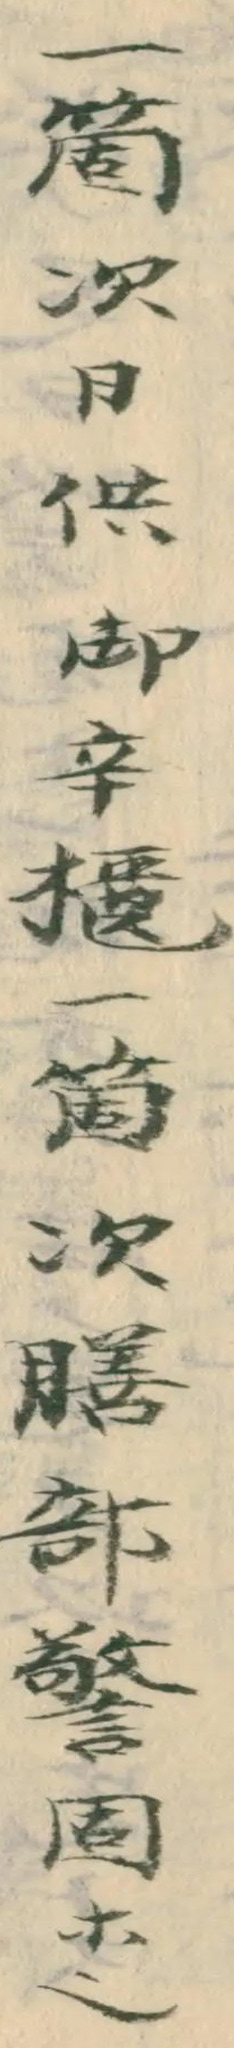一箇次日供御辛櫃一箇次膳部警固等也
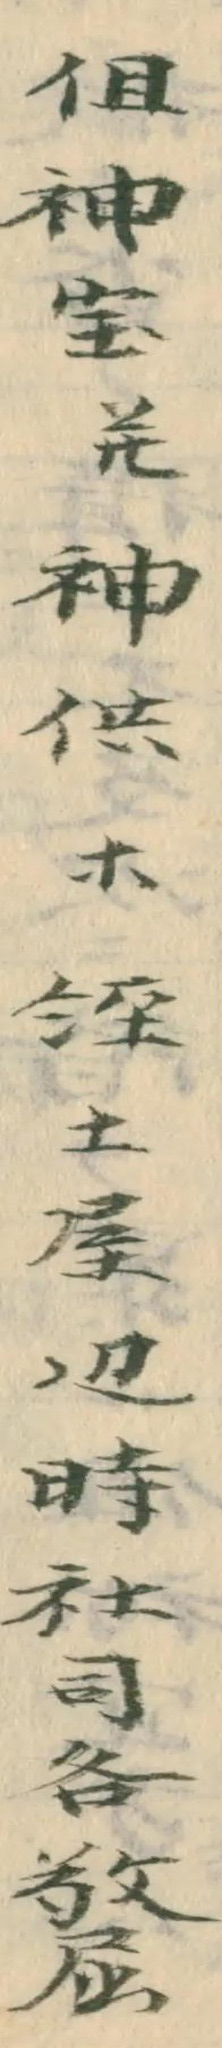但神宝并神供等経土屋辺時社司各敬屈
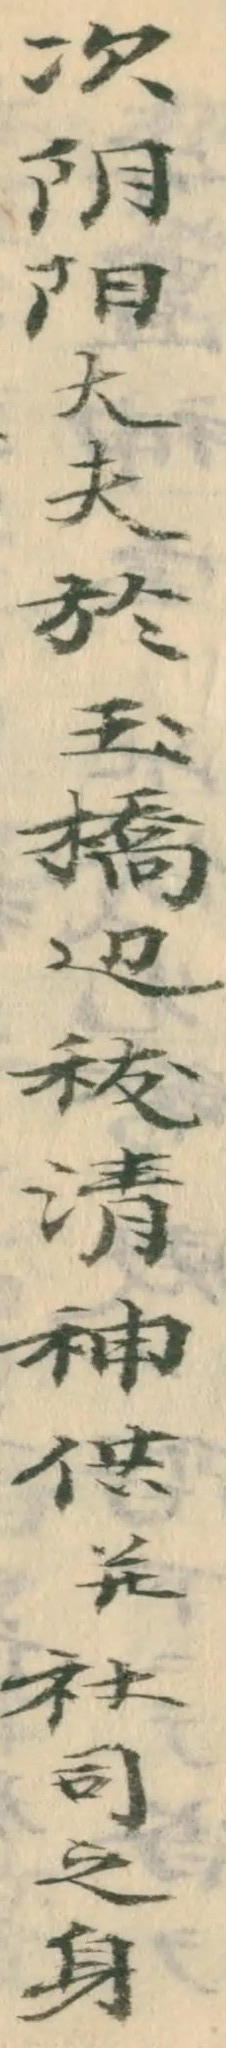次陰陽大夫於玉橋辺祓清神供并社司之身

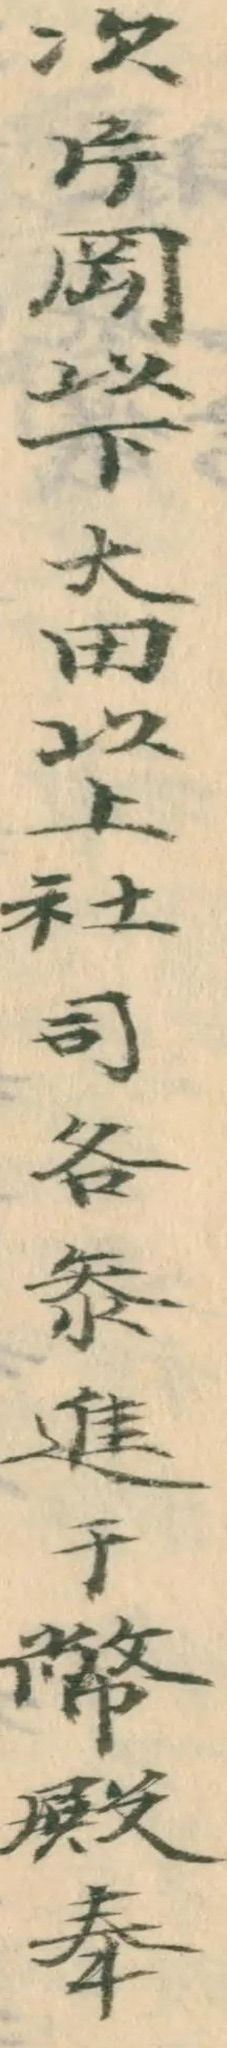次片岡以下大田以上社司各参進于幣殿奉
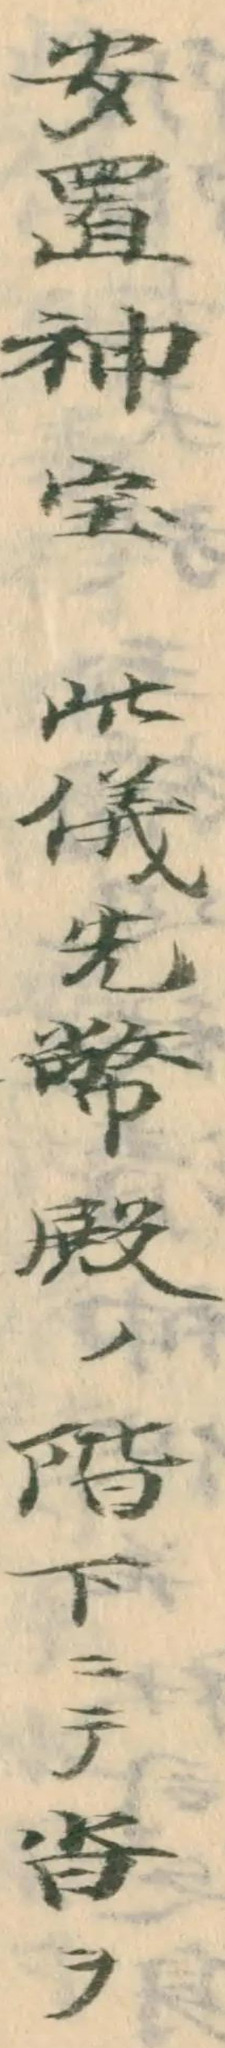安置神宝此儀先幣殿ノ階下ニテ沓ヲ
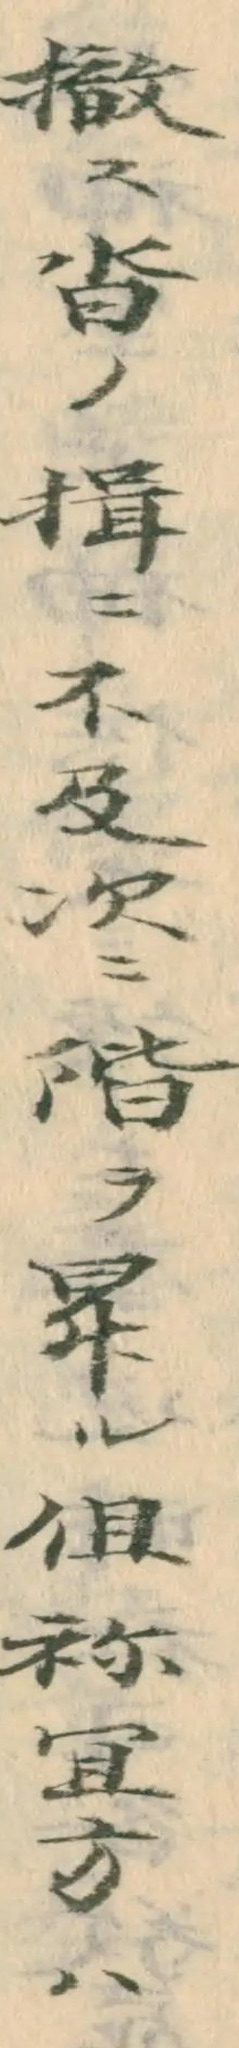撤ス沓ノ揖ニ不及次ニ階ヲ昇ル但禰宜方ハ
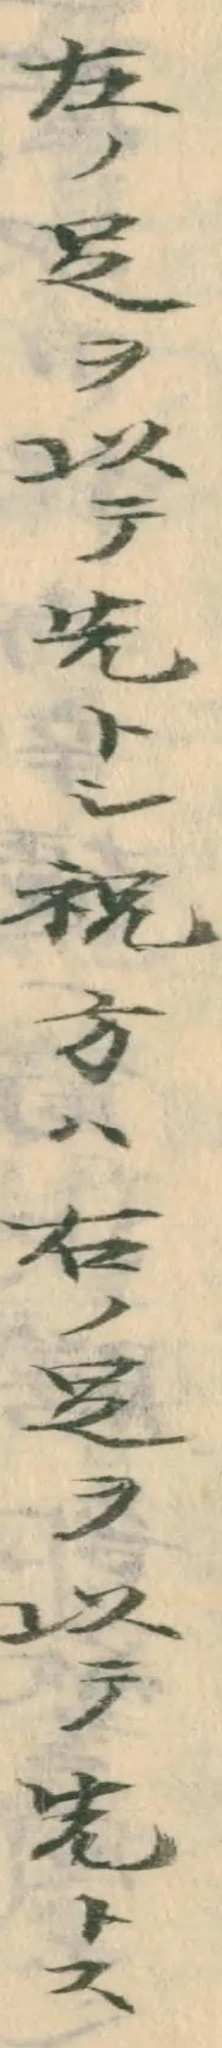左ノ足ヲ以テ先トシ祝方ハ右ノ足ヲ以テ先トス
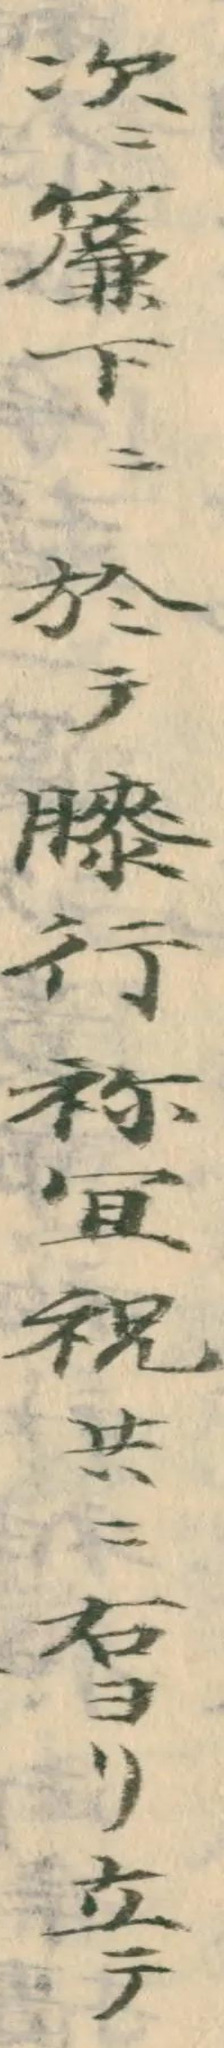次ニ簾下ニ於テ膝行禰宜祝共ニ右ヨリ立テ
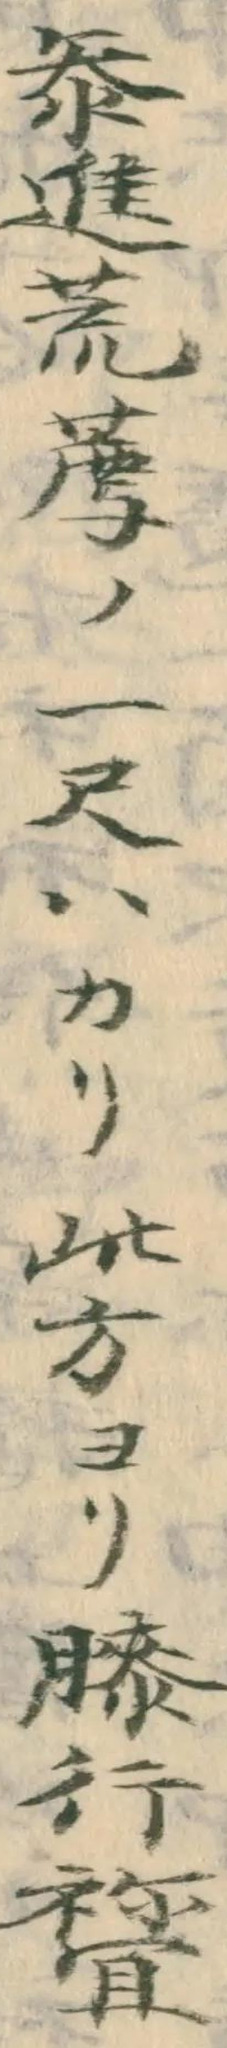参進荒薦ノ一尺ハカリ此方ヨリ膝行禰宜
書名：賀茂社記録. 第5冊
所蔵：国立国会図書館 National Diet Library, JAPAN
